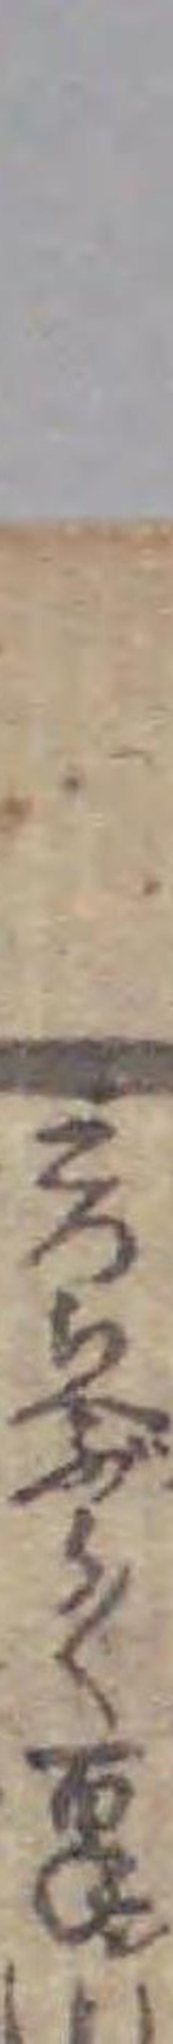こつちへぶら〳〵百年
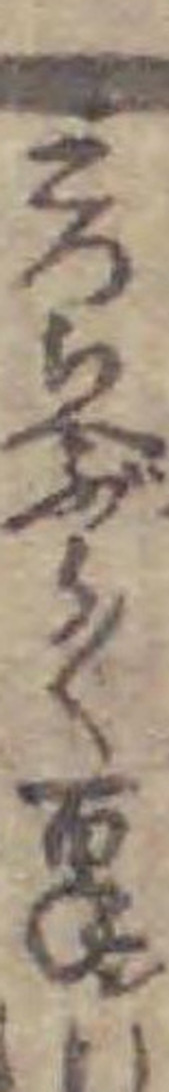こつちへぶら〳〵百年
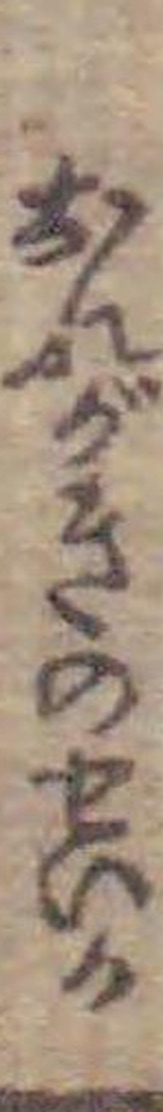おれがきのせいか
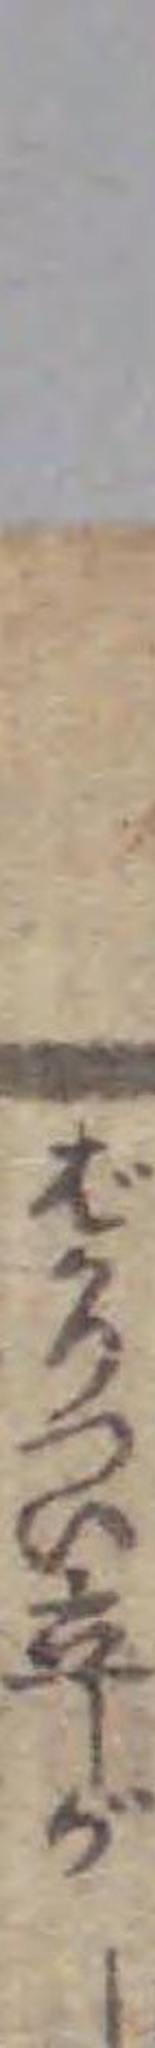ばかりつい立しが
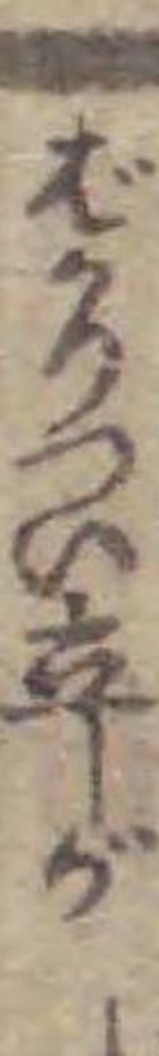ばかりつい立しが
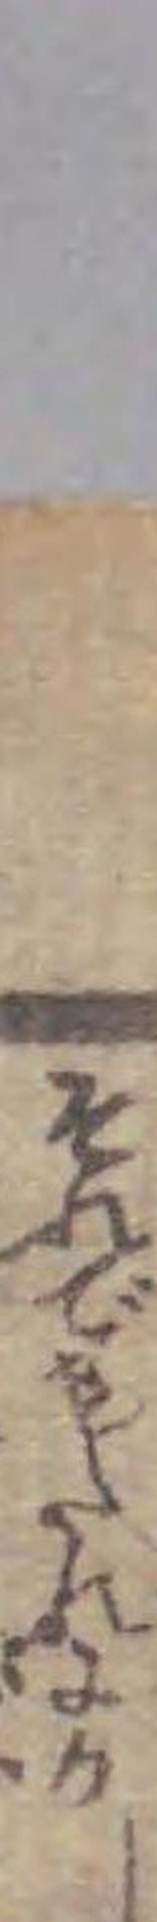それでもたれにか
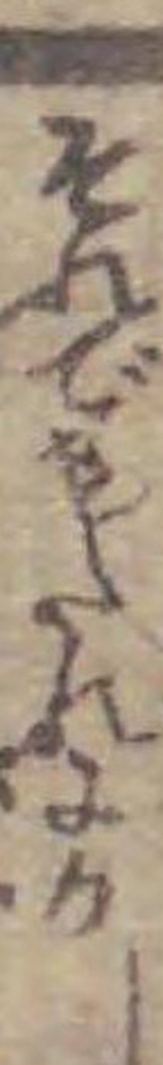それでもたれにか
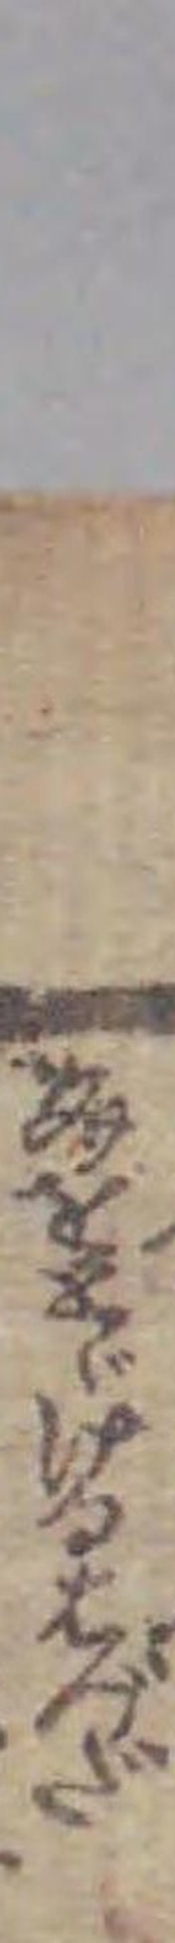文をとゞけるはづだ
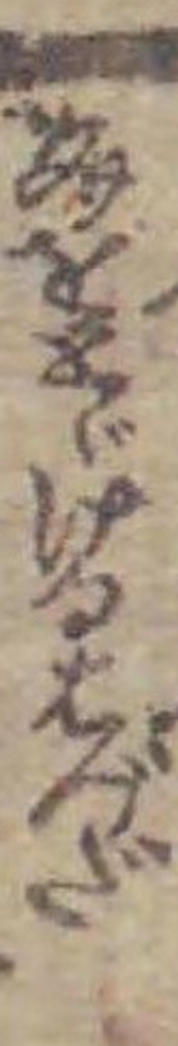文をとゞけるはづだ
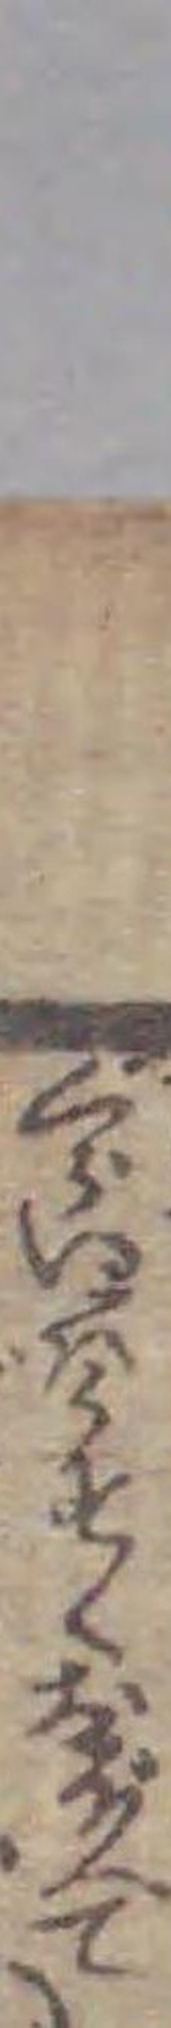くらいはうす〳〵おぼへて
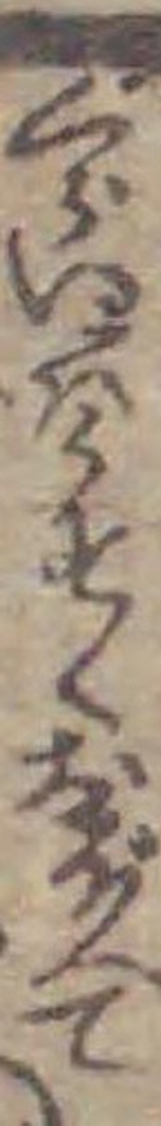くらいはうす〳〵おぼへて
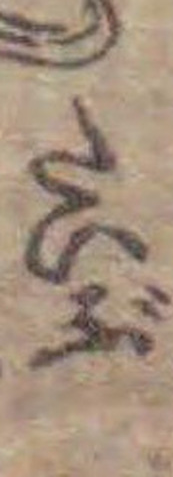たいぶ
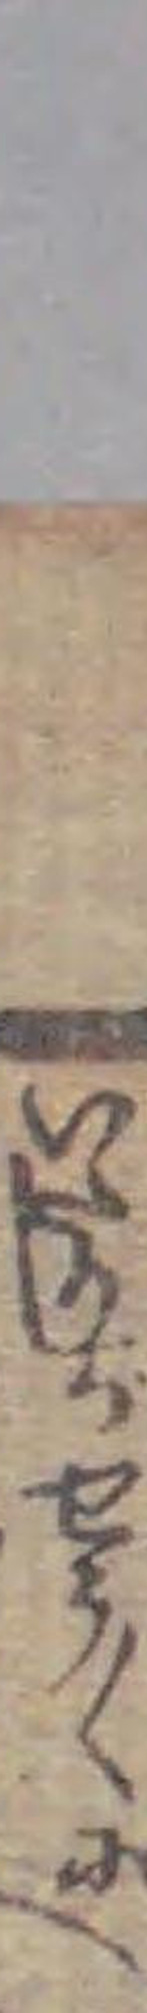いたりしがせう〳〵に
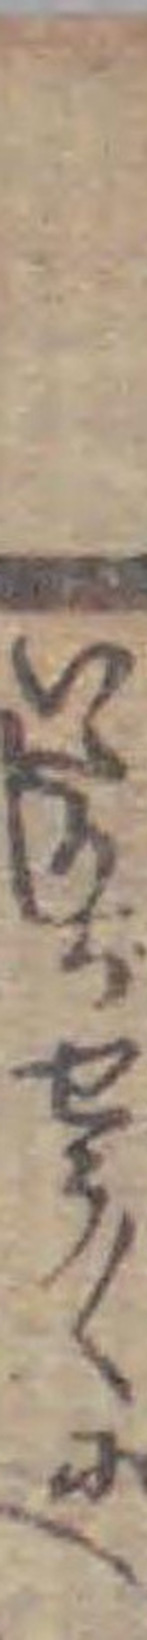いたりしがせう〳〵に
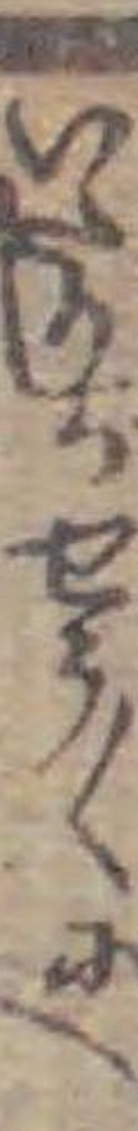いたりしがせう〳〵に
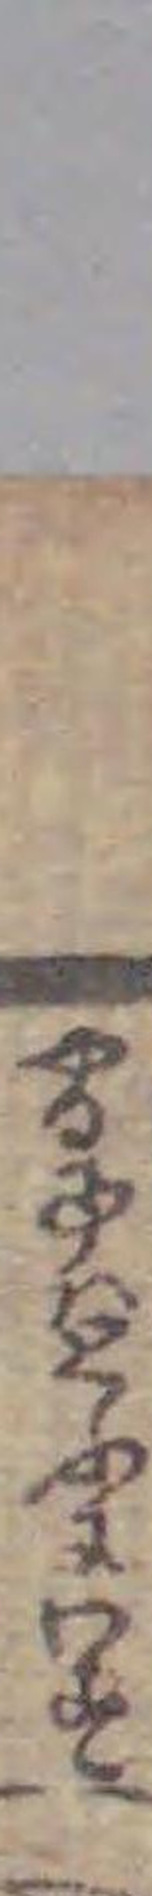やる事はとふにわす
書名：年寄之冷水曽我 : 3巻
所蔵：国立国会図書館 National Diet Library, JAPAN
